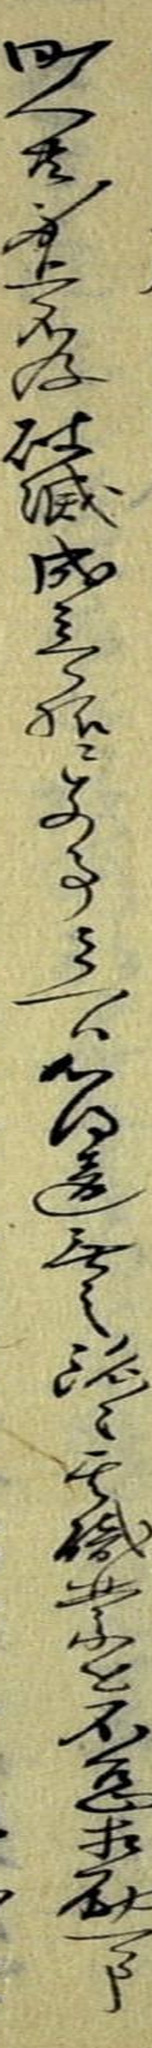町人共身上不及破滅成立候様ニとの事ニ候へは心得違無之銘々其職業を不怠相励可申
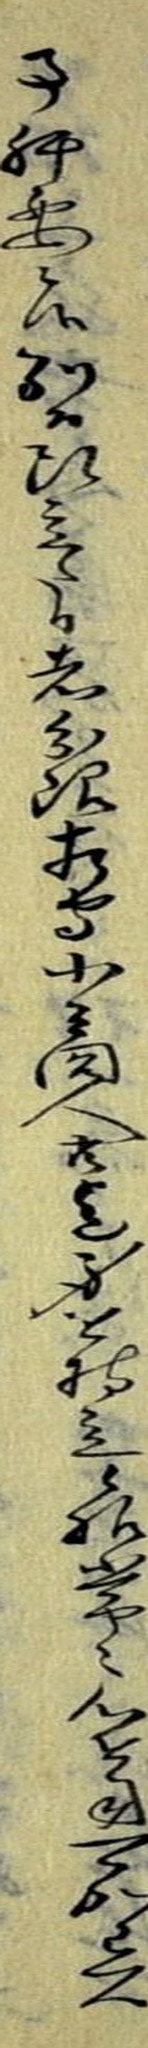事肝要ニ候別而頭立たる者分限相守小商人共身を持立候様常々心を用可加異
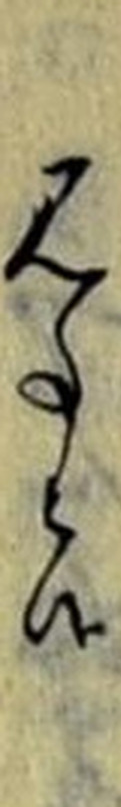見事ニ候
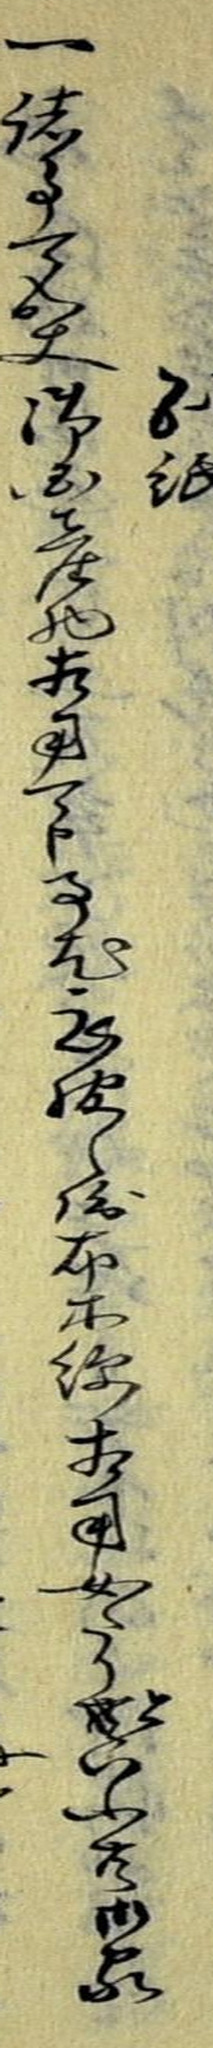一諸事可成丈御国産物相用可申事尤衣服之儀布木綿相用女たり共といふ共御家
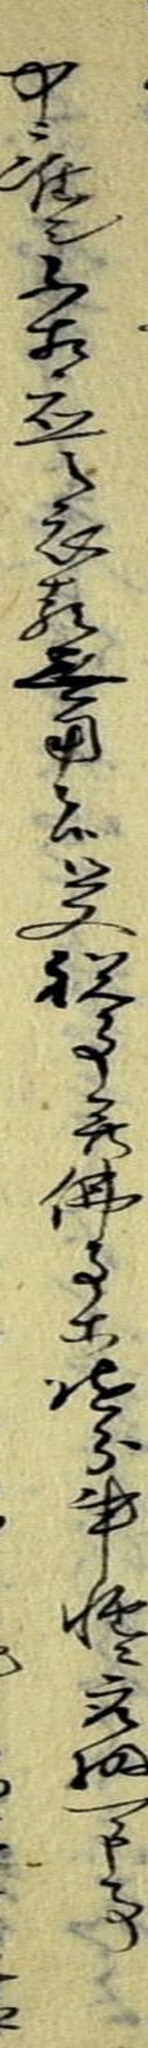中ニ准シ不相応之衣類無用ニ候且又祝事并仏事等随分事軽ニ取扱可申事
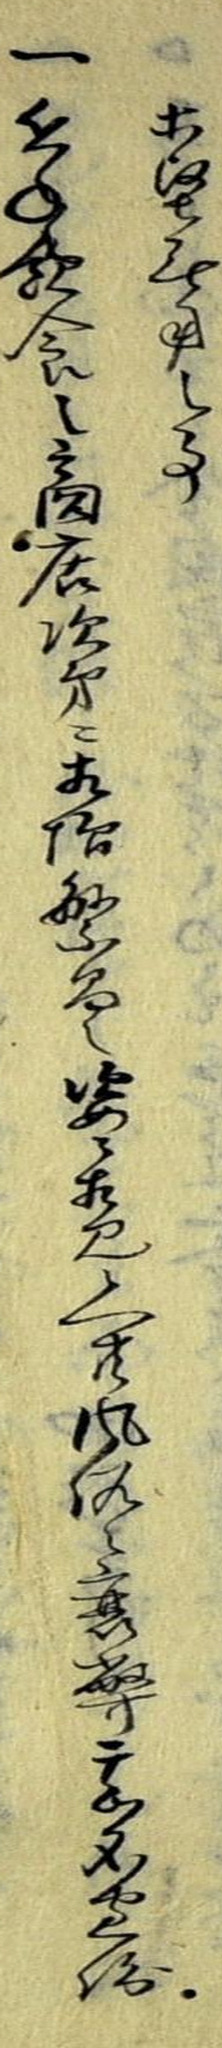一近年飲食之商店次第ニ相増繁昌之姿相見候へ共風俗之衰弊甚不宜儀
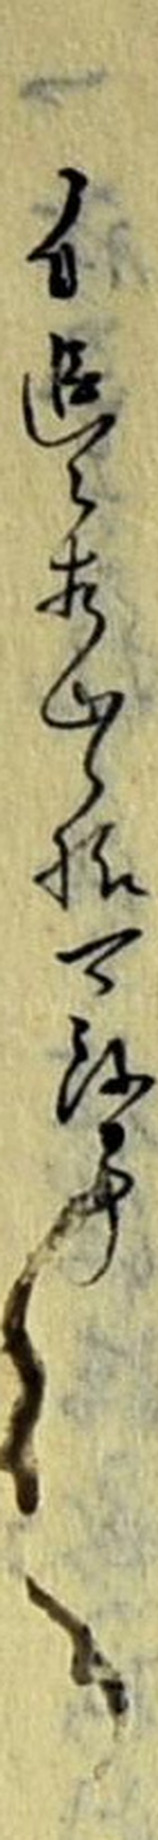ニ付追々相止候様可致事
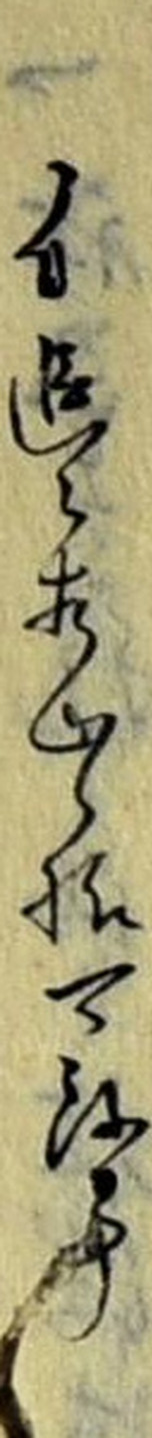ニ付追々相止候様可致事

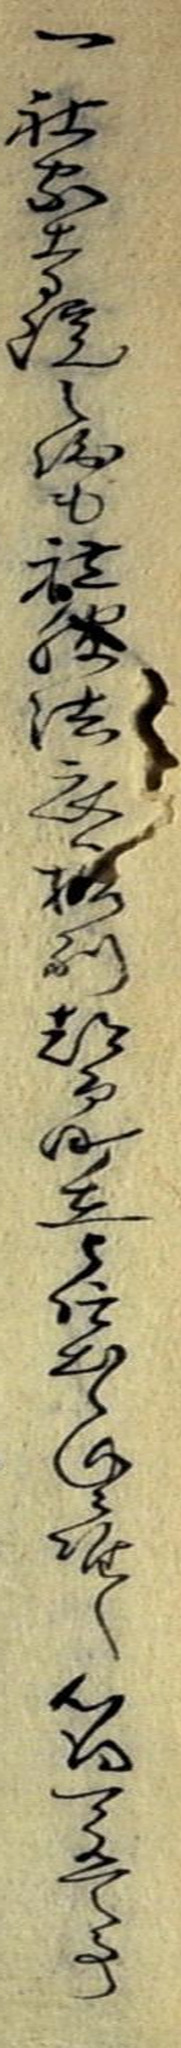一社家寺院之儀も礼服法衣ハ格別都而町在被仰出候趣ニ准し心得可有之事
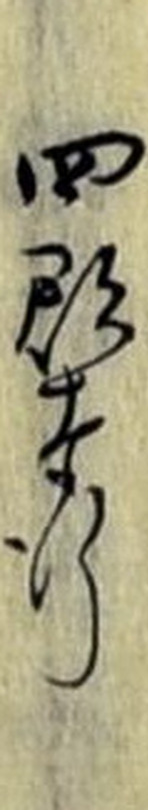四郡奉行
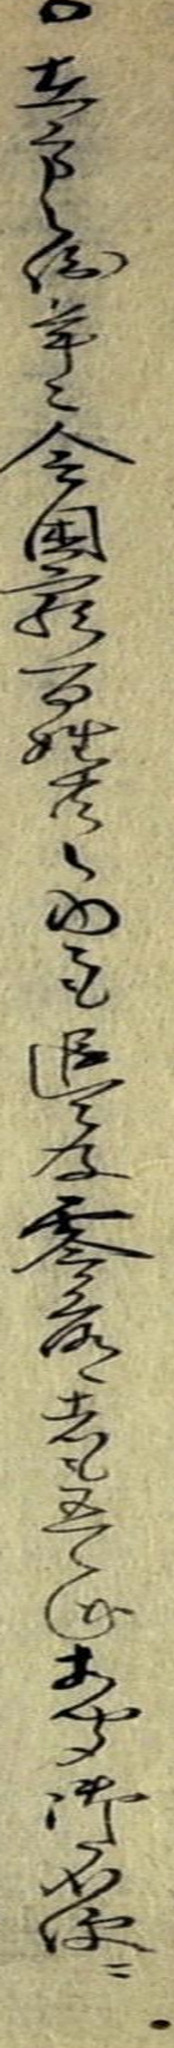○在方之儀年々令困窮百姓共之内ニも々追々及零落候者有之趣相聞御不便ニ
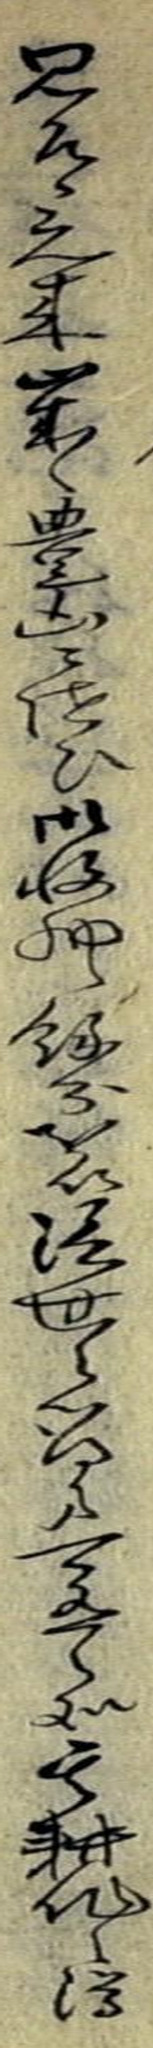思召候元来歳之豊凶ニ随ひ御収納之余分を以渡世之心得方可有之処其耕作之得
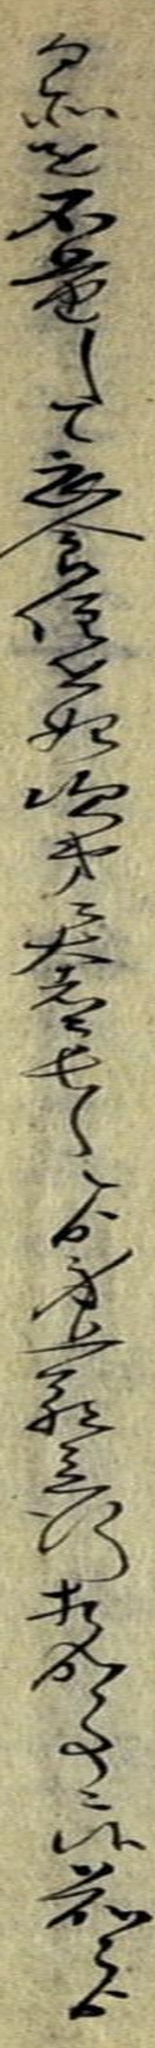る所を不量して衣食住を始次第ニ奢ニ長し之ゟ身上難立行相成候事ニ候前々ゟ
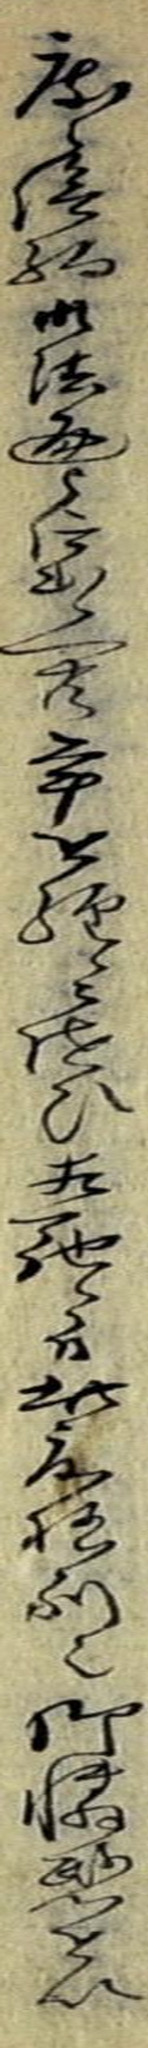度々倹約御法通被仰出候へ共年を経候ニ随ひ相弛候ニ付此度格別之御憐愍を以
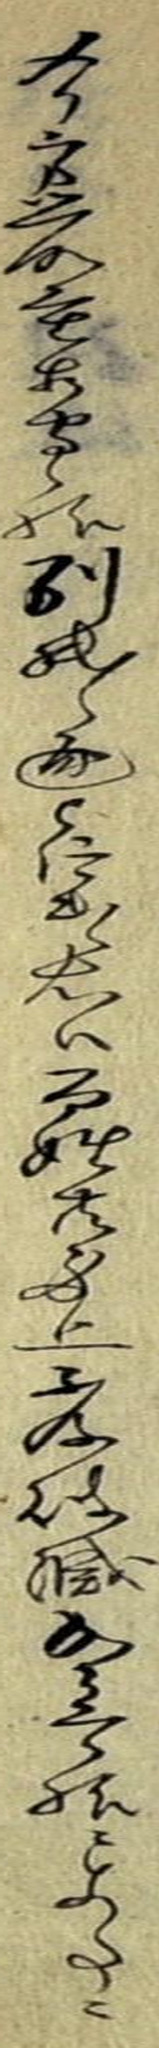〆り方厳重相守候様別紙之通被仰出候右ハ百姓共身上不及破滅成立候様ニとの事ニ
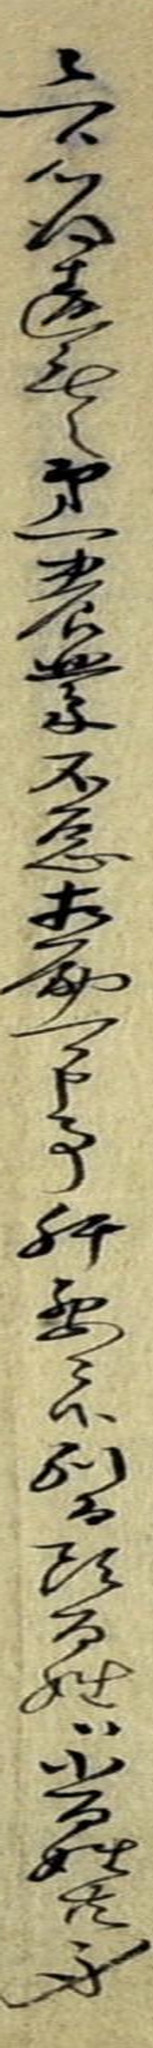候へハ心得違無之第一養業不怠相励可申事肝要ニ候別而頭百姓ハ小百姓共身
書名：命令之部 五
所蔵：福井県文書館 Fukui Prefectural Archives
